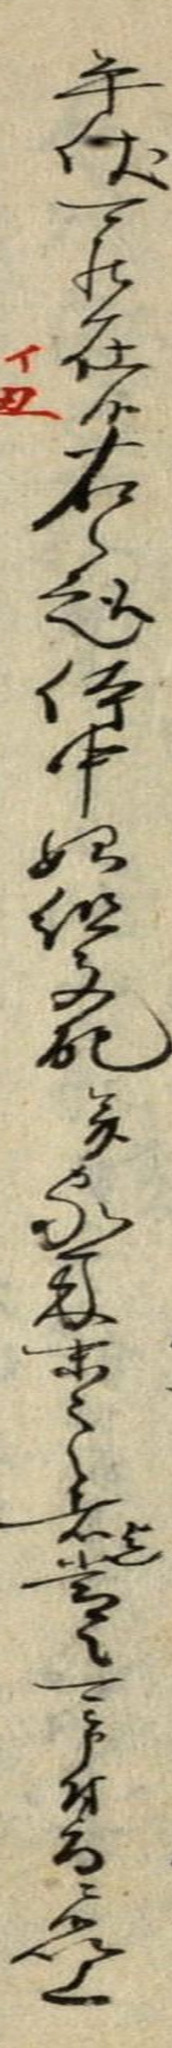平伏可罷在右之趣侍中始組支配幷家来末々之者迄常々可申付旨に候以上
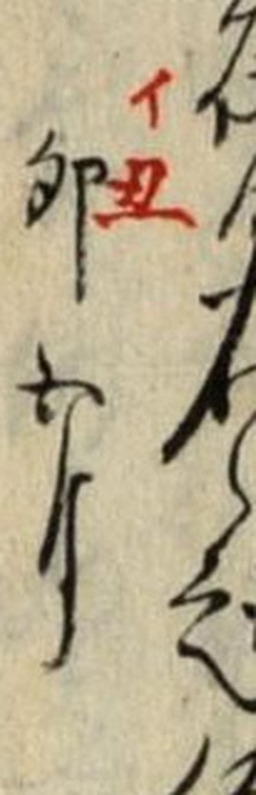卯五月
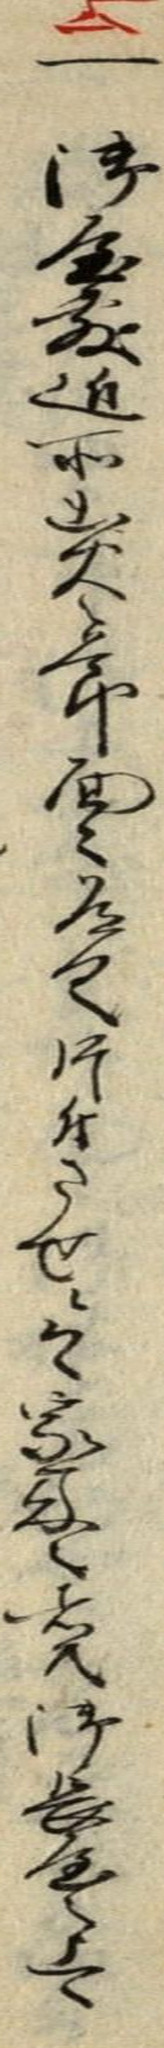イ△一御屋敷近所出火之節面々道具片付させ候はゝ家来之者共御長屋の上へ
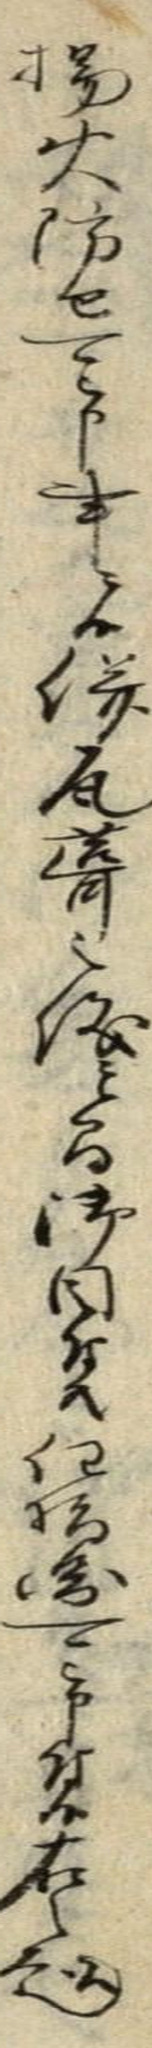揚火防せ可被申事に候幷瓦葺之儀に候間御目付共任指図可被申付候右之趣
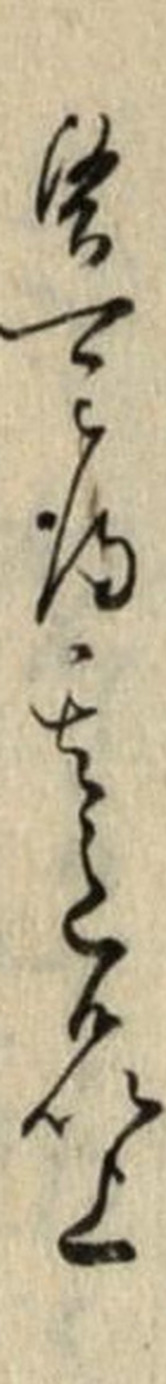堅可被得其意候以上
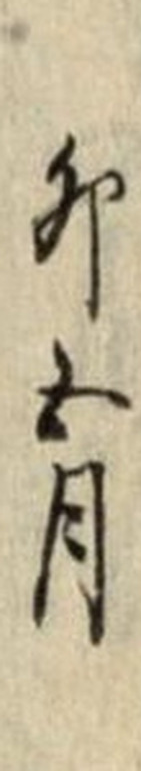卯五月
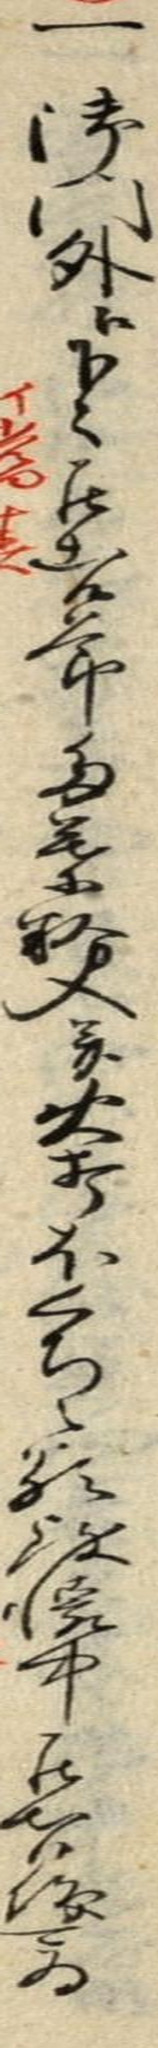イ○一御門外江下々罷出候節多葉粉入幷火打ほくち之類致懐中罷出候儀可為
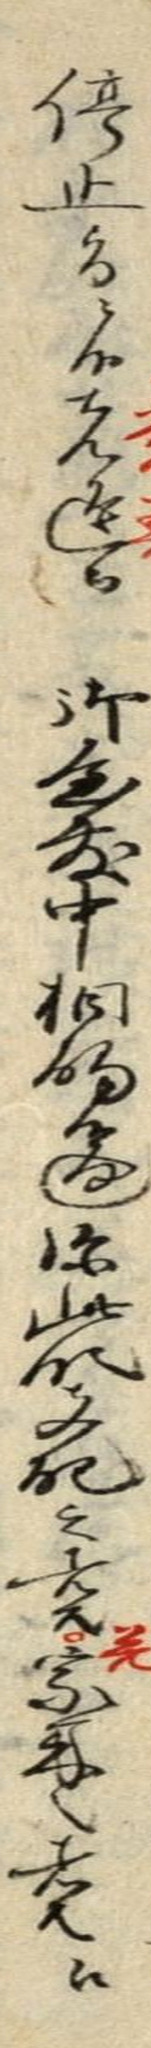停止旨に候先達而御屋敷中相触候通弥此段支配之者共家来之者共江
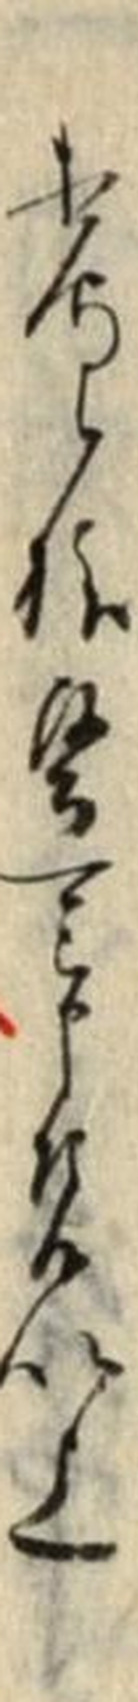相守候様堅可被申付候以上
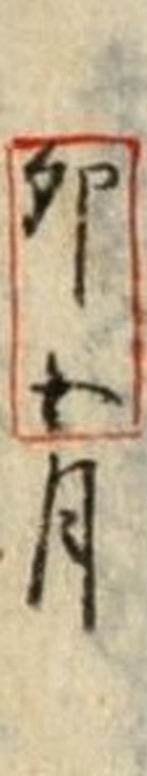卯五月

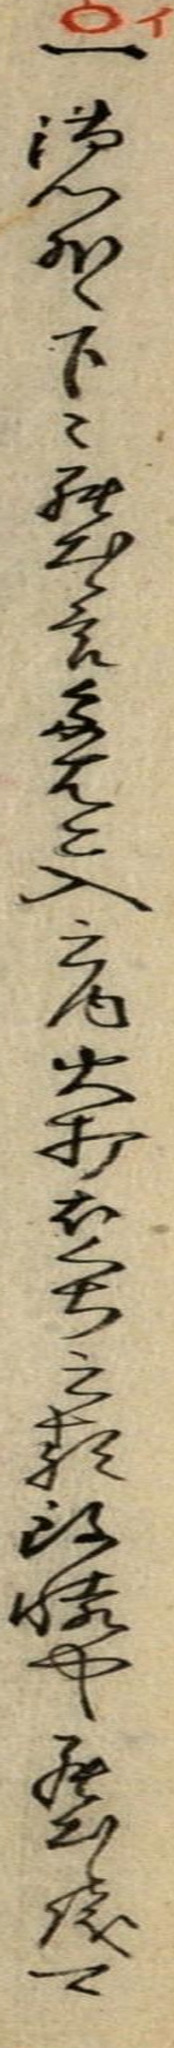イ○一御門外へ下々罷出候節たはこ入之内火打ほくち之類致懐中罷出候儀可
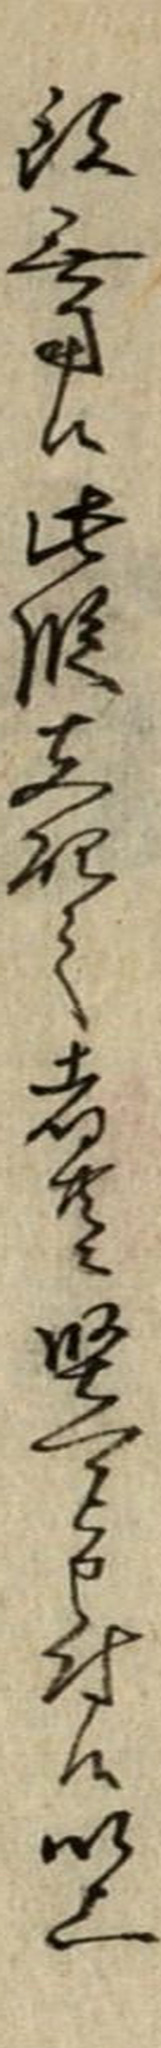致無用候此段支配之者共に堅可被申付候以上
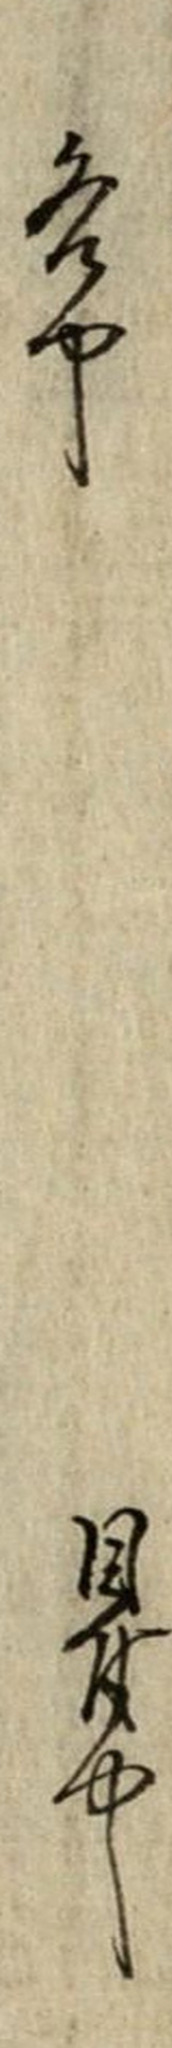各中目付中
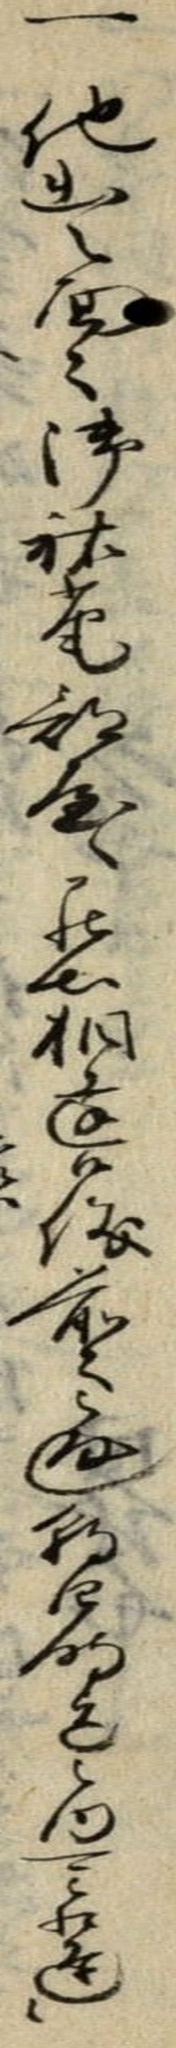一他出之面々御祐筆部屋へ罷出相達候儀前々之通朝四時迄之内可被相達候
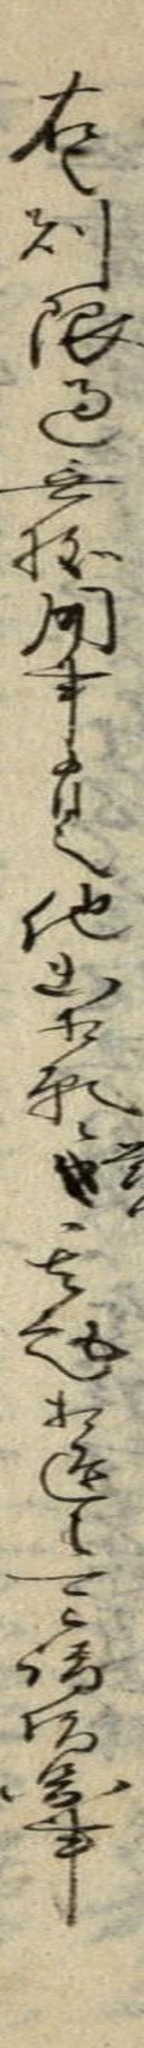右之刻限過無據用事有之他出相願候節は其趣相達し可被請指図事
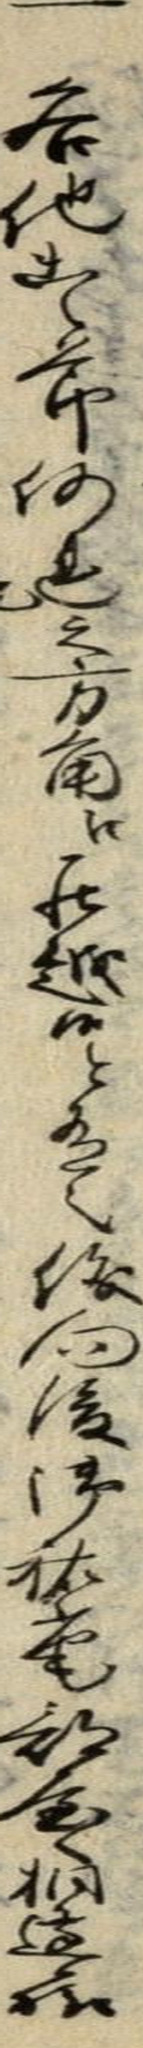一各他出之節何れ之方角江罷越候と有之儀向後御祐筆部屋へ相達候様
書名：三都并道中之部
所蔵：福井県文書館 Fukui Prefectural Archives
